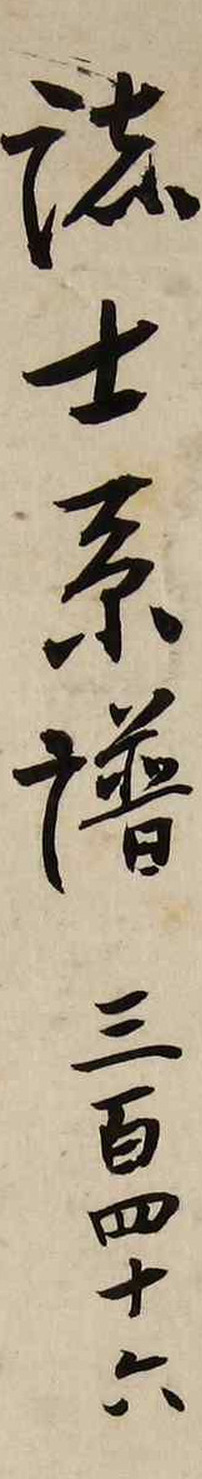諸士系譜三百四十六

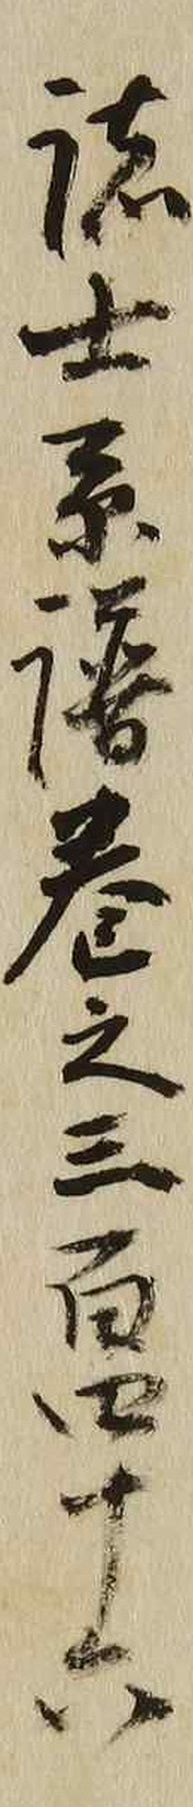諸士系譜巻之三百四十六
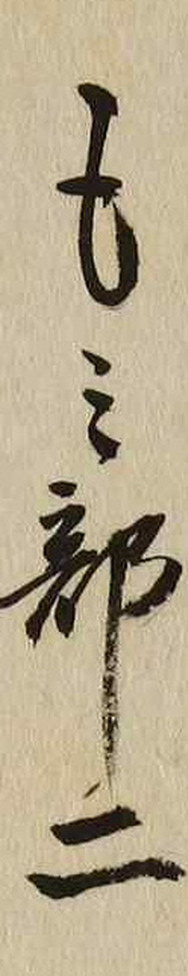も之部二
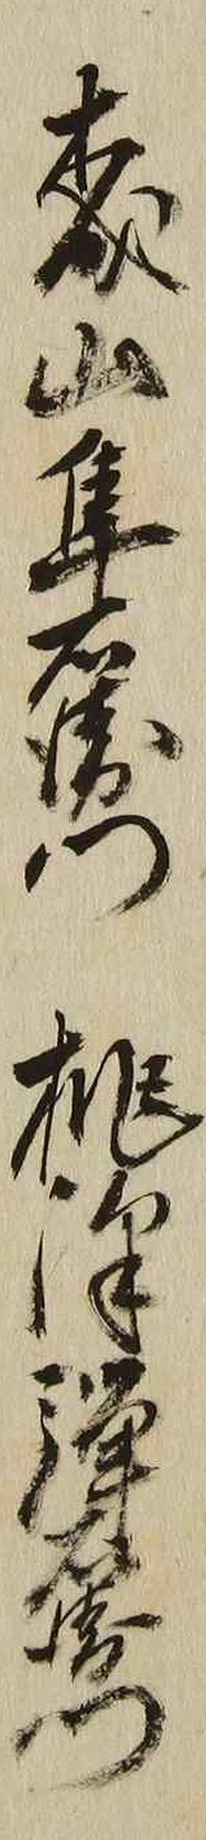森山隼右衛門桃沢弾右衛門

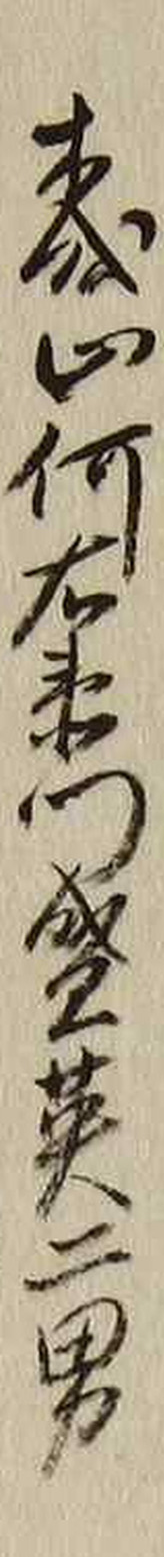森山何右衛門盛英二男
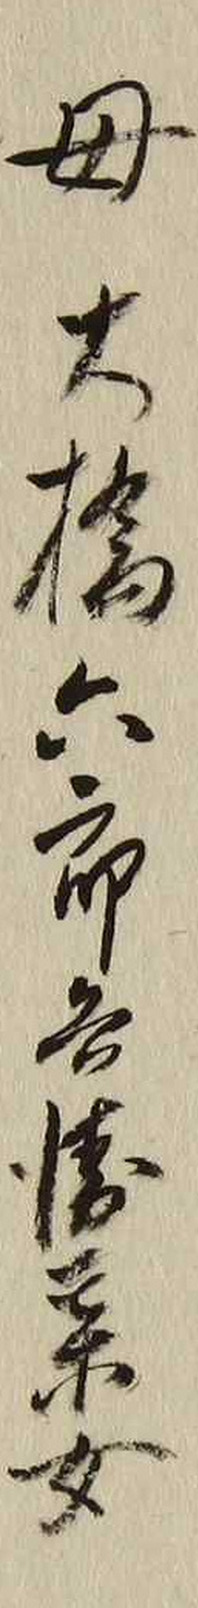母大橋六郎兵衛某女
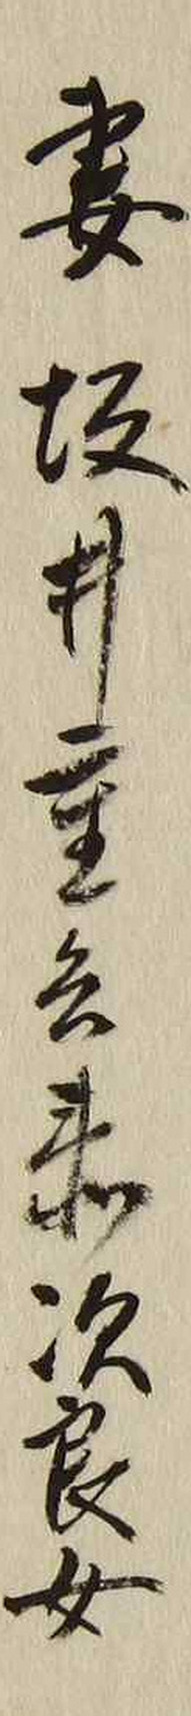妻坂井重兵衛次良女
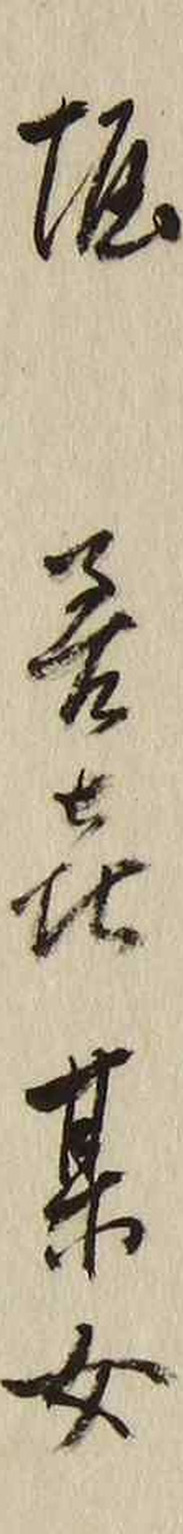堀善喜某女

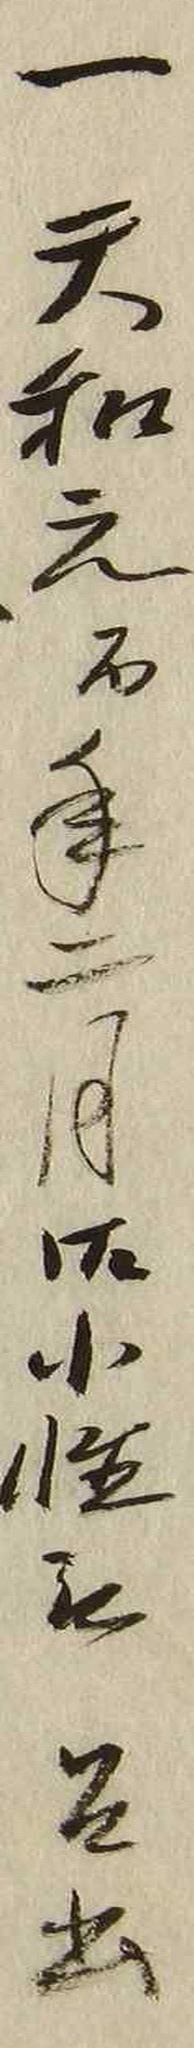一天和元酉年二月御小性被召出
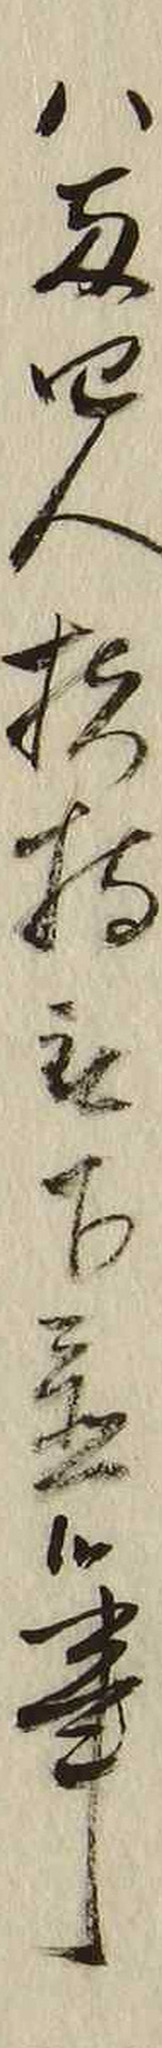八両四人扶持被下置候事
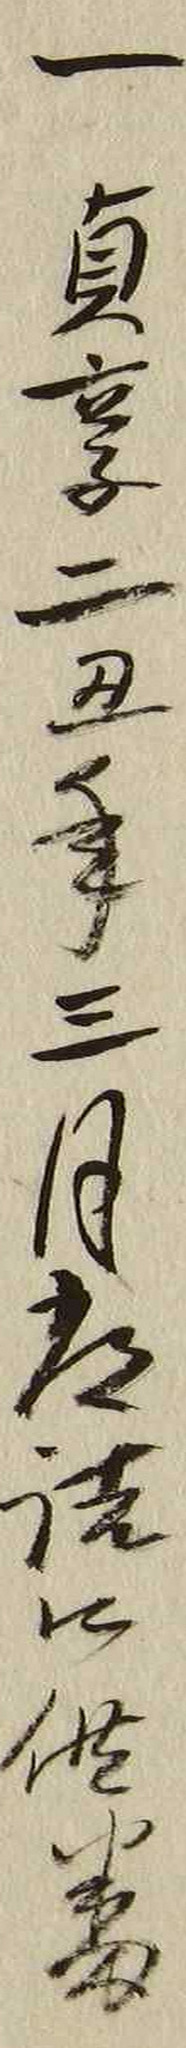一貞享二丑年三月常詰御供番
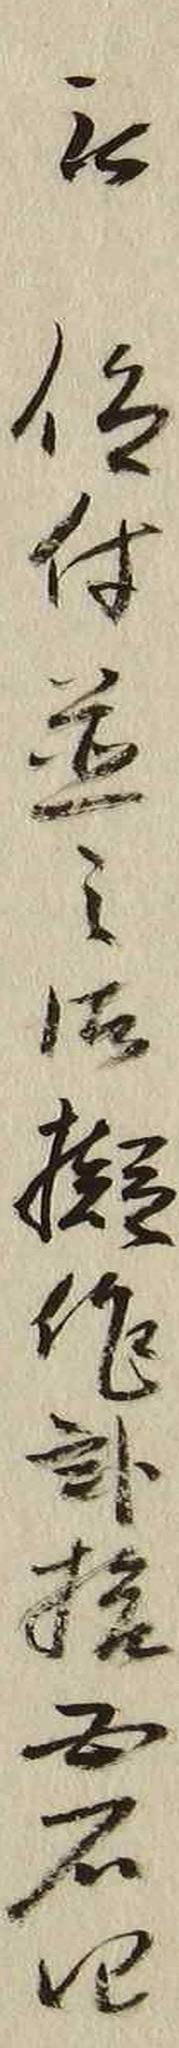被仰付並之御擬作弐拾五石四
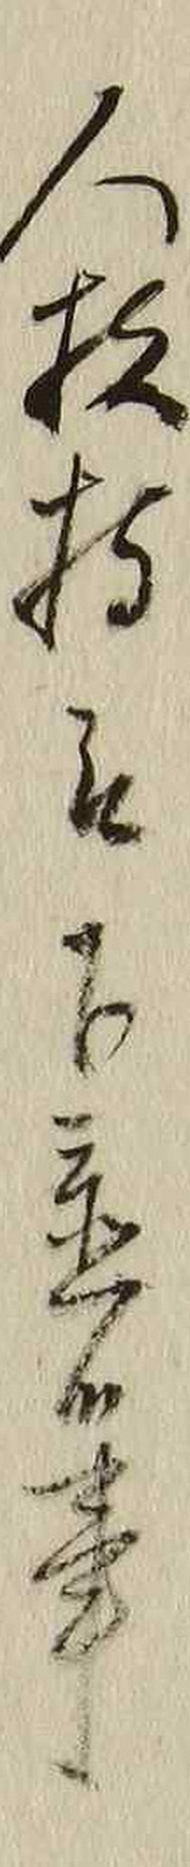人扶持被下置候事
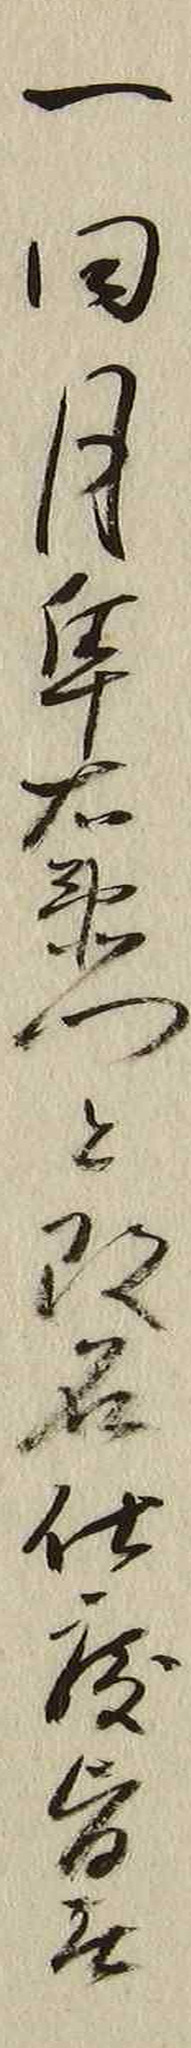一同月隼右衛門と改名仕度旨被
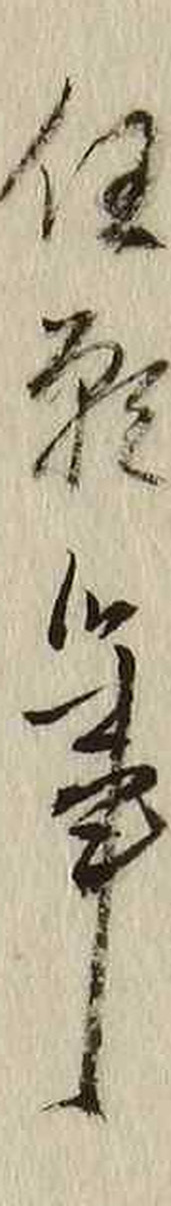任願候事
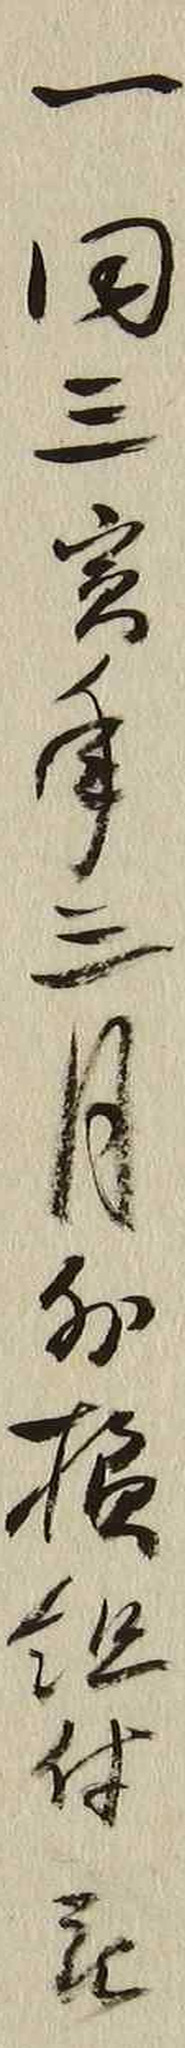一同三寅年三月外様組付被
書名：諸士系譜　巻之346　も之部2
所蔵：会津若松市立会津図書館
